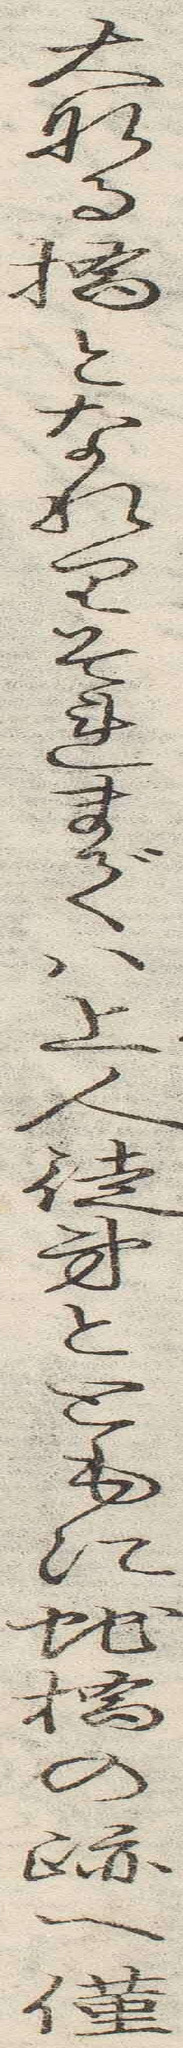大なる橋となれりそれまでは上人徒㐧とともに蛇橋の跡へ僅
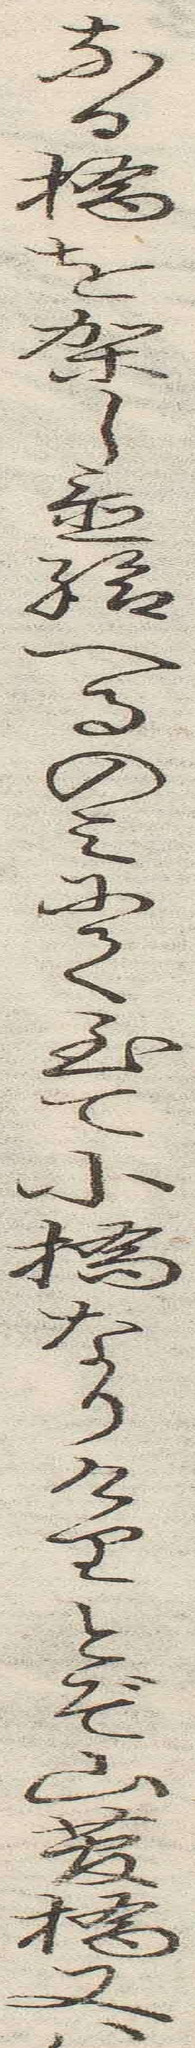なる橋を架し置給へるのみにて至て小橋なりけりとぞ山菅橋又は
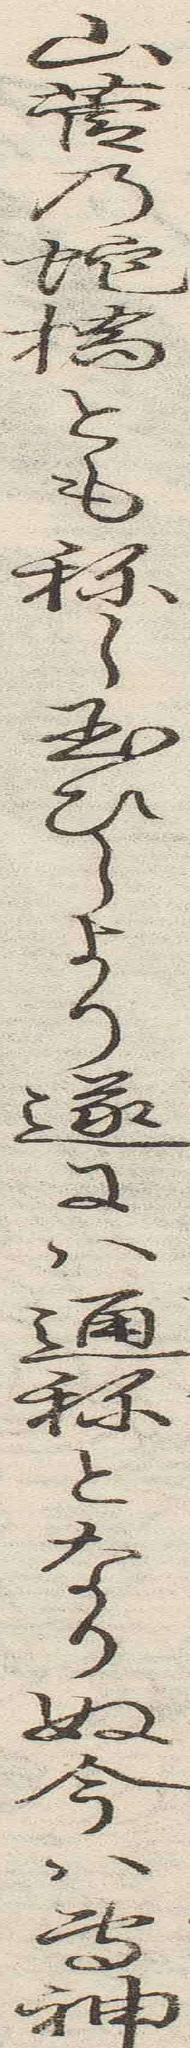山菅の蛇橋とも称し玉ひしより遂には通称となりぬ今は專神
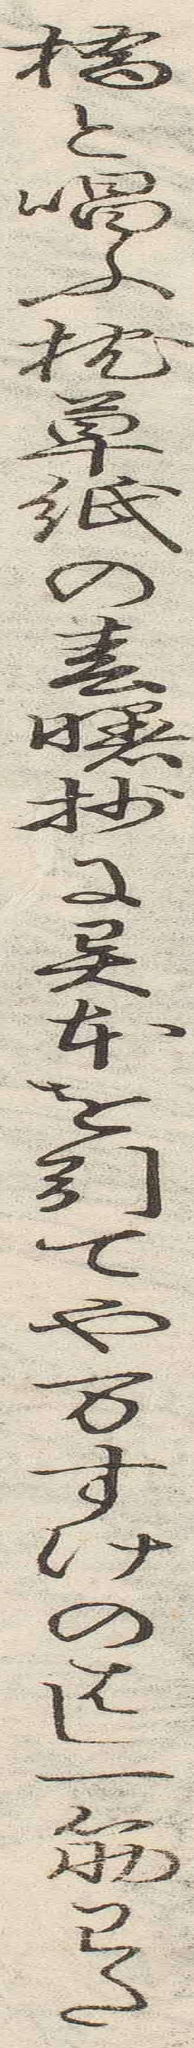橋と唱ふ枕草紙の春曙抄に異本を引てやますけのはし一筋わた
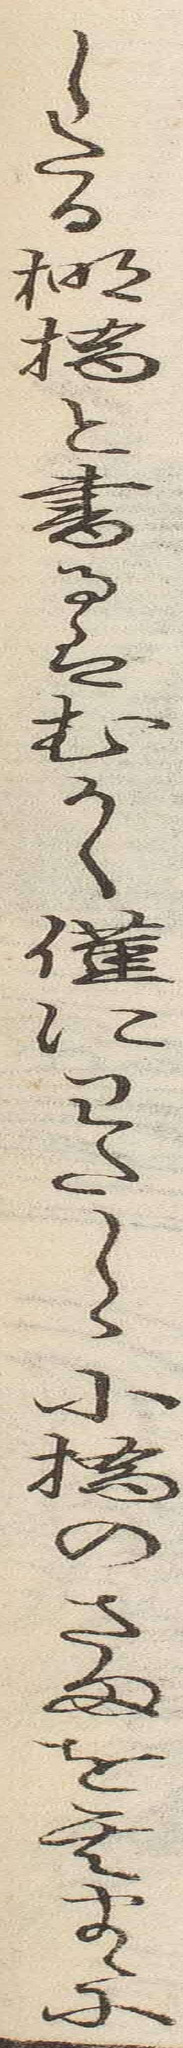したる棚橋と書るはむかし僅にわたしゝ小橋のさまを其まゝに
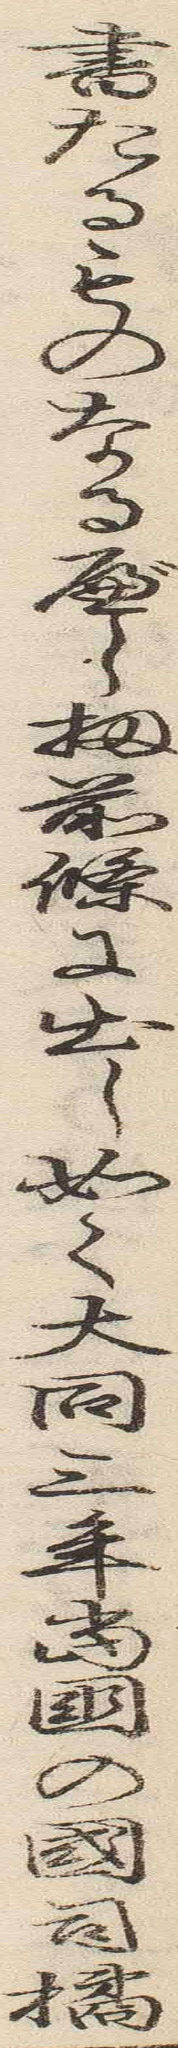書たるものなるべし扨前條に出し如く大同三年當國の國司橘
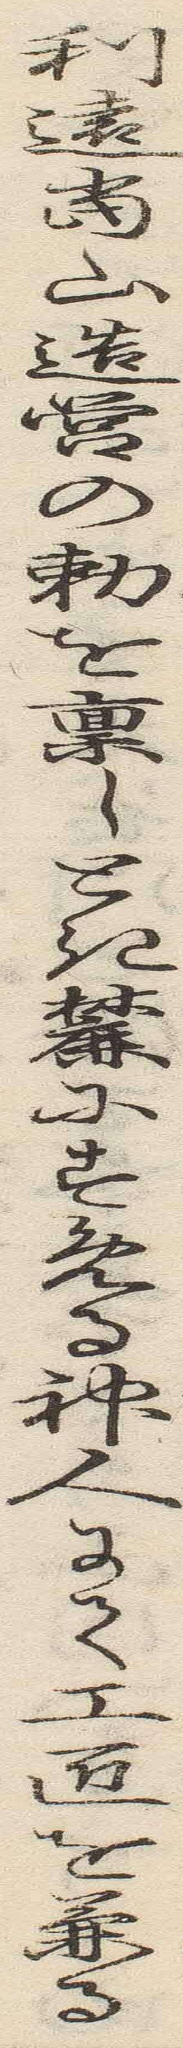利遠當山造営の勅を稟しとき麓にすめる神人にて工匠を兼る
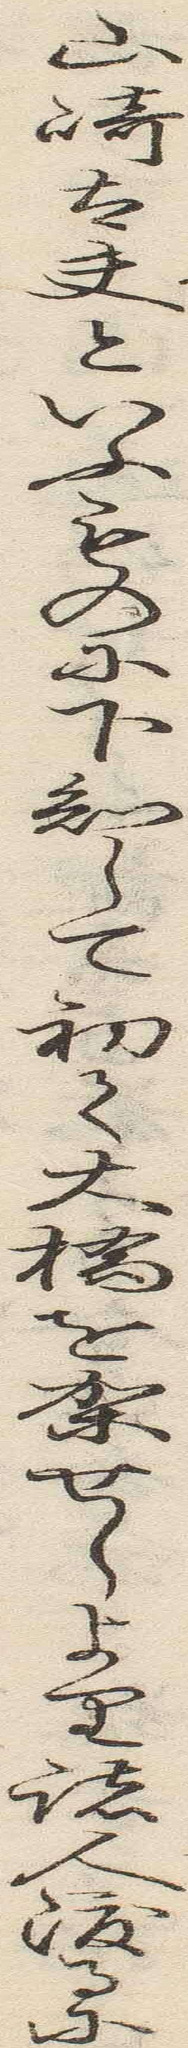山崎太夫といふものに下知して初て大橋を架せしより諸人渡るに
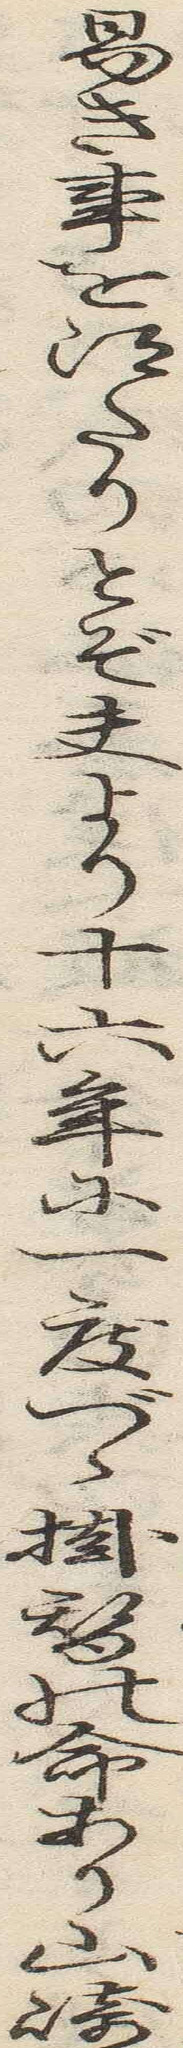易き事を得たりとぞ夫より十六年に一度づゝ掛替の命あり山崎
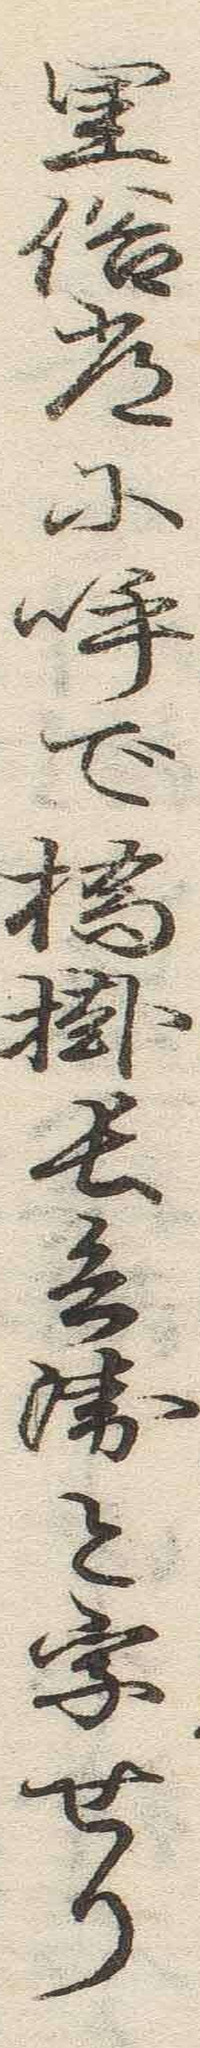里俗常に呼で橋掛長兵衞と字せり
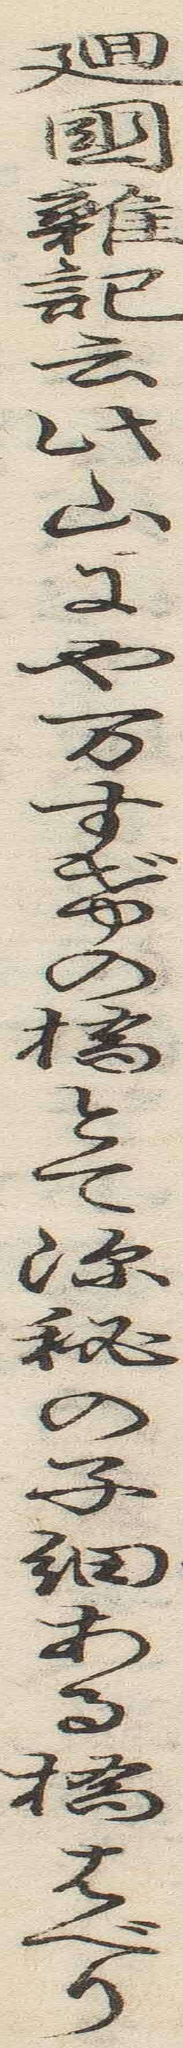廽國雜記云此山にやますげの橋とて深秘の子細ある橋はべり
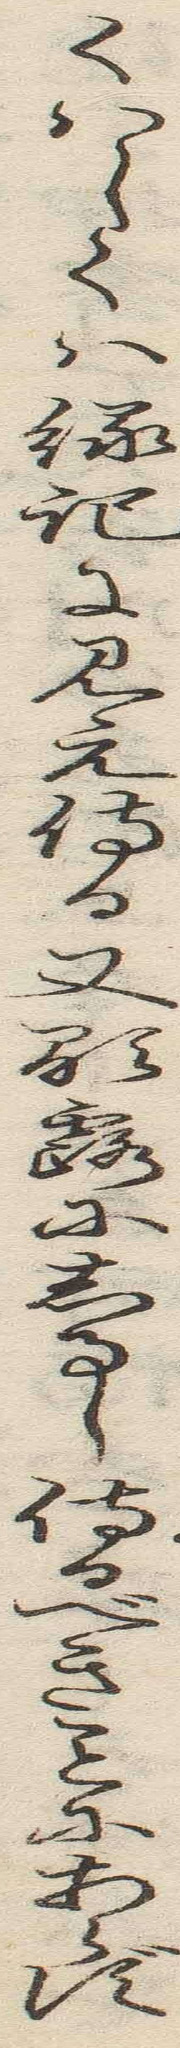くはしくは縁記に見え侍る又顕露にしるし侍るべきことにあらず
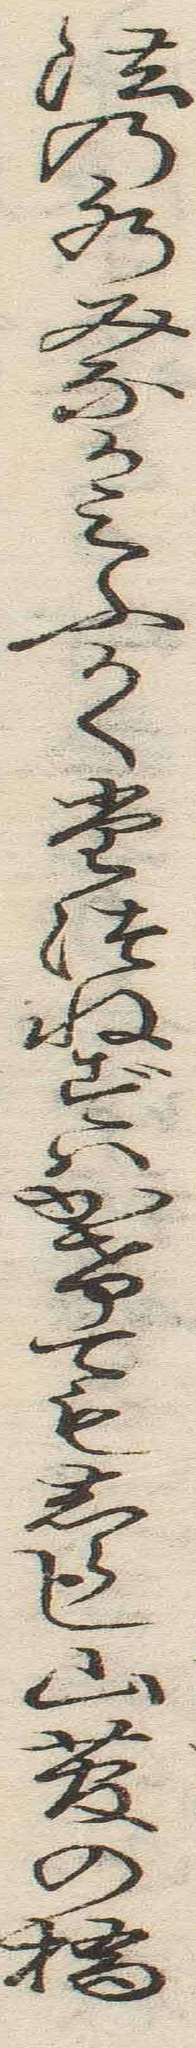法の水みなかみふかくたつねずはかけてもしらし山菅の橋
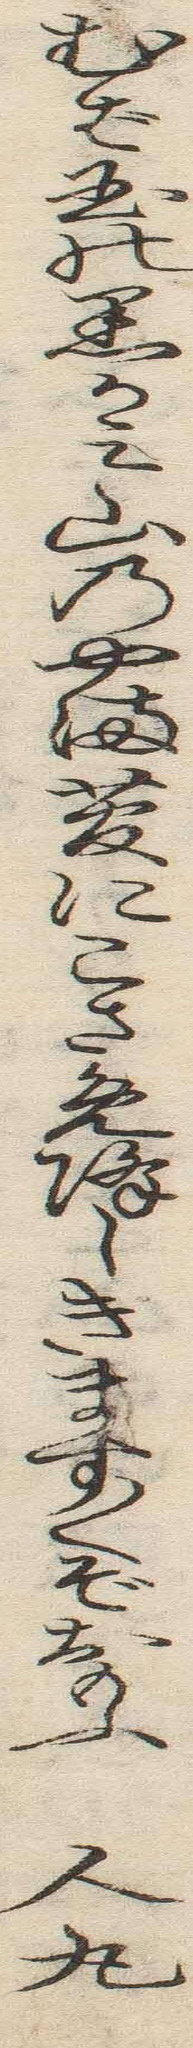万葉むば玉の黒かみ山のやま菅にこさめ降しきます〳〵ぞおもふ人丸
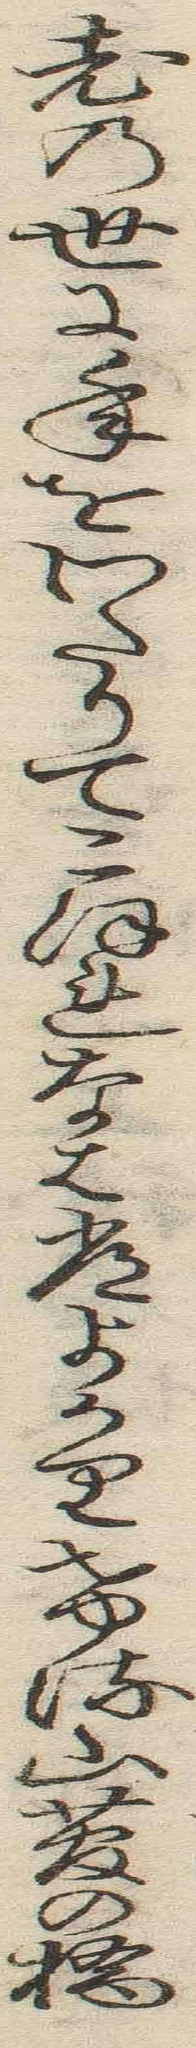懐中老の世に年をわたりてこほれなは常よかりける山菅の橋

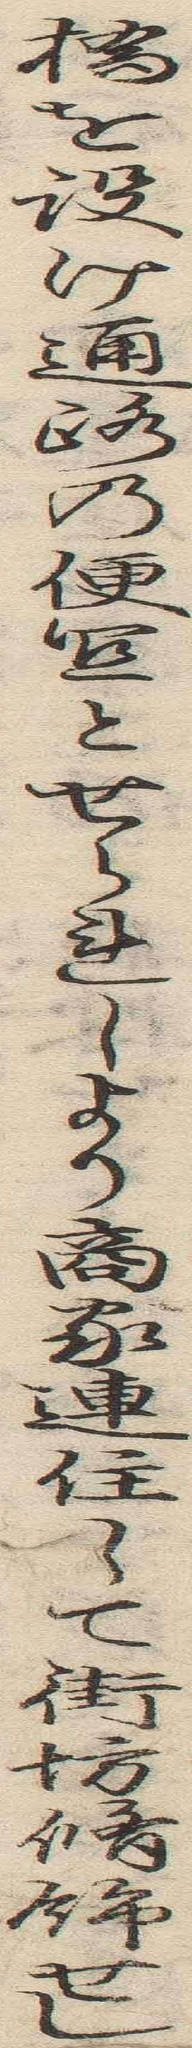橋を設け通路の便冝とせられしより商家連住して街坊修飾せし
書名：日光山志
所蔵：東京学芸大学附属図書館 国文学研究資料館
